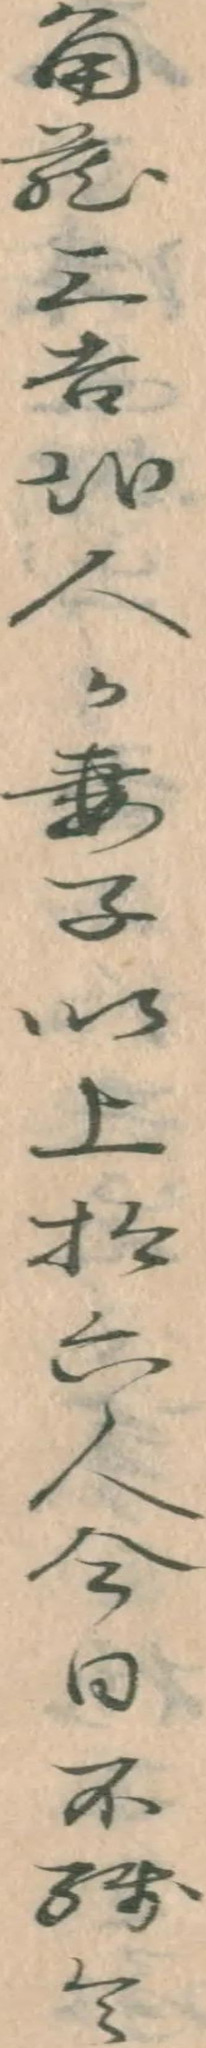角蔵三吉弐人か妻子以上拾六人今日不残令
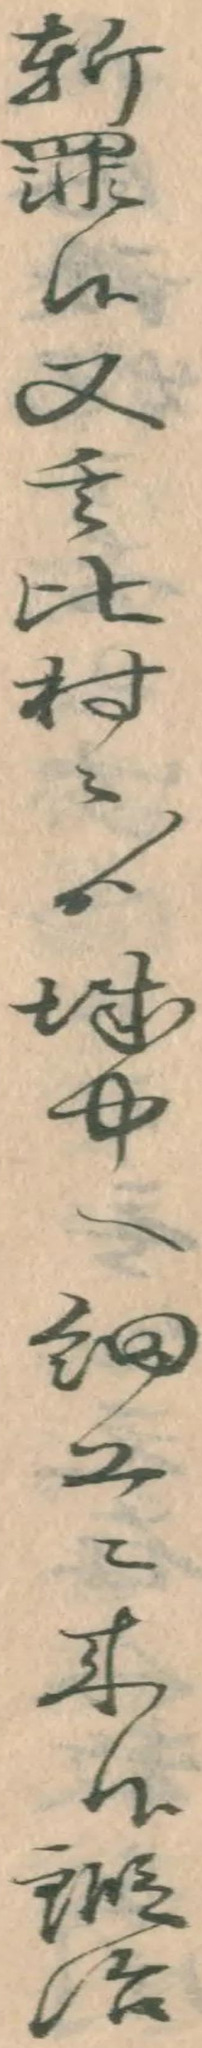新罪候又其此村々ゟ城中へ細工に来候鍛冶
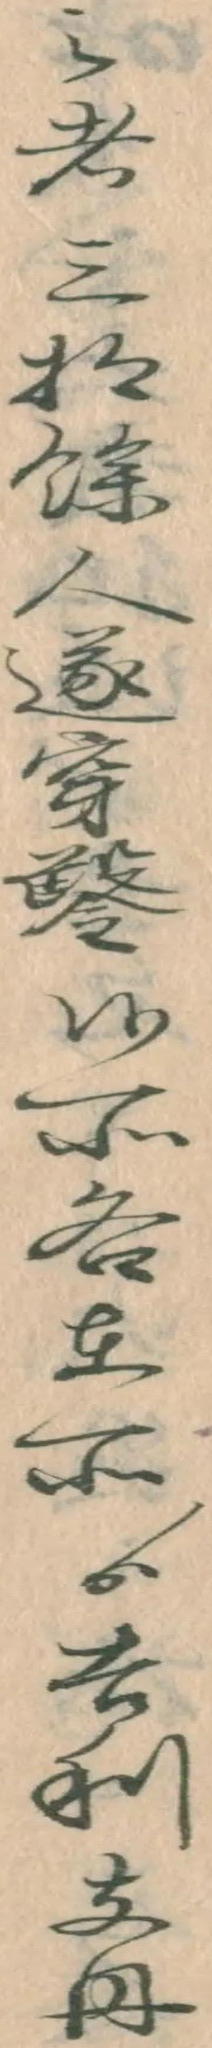者三拾余人遂穿鑿候候所各在所ゟ吉利支丹
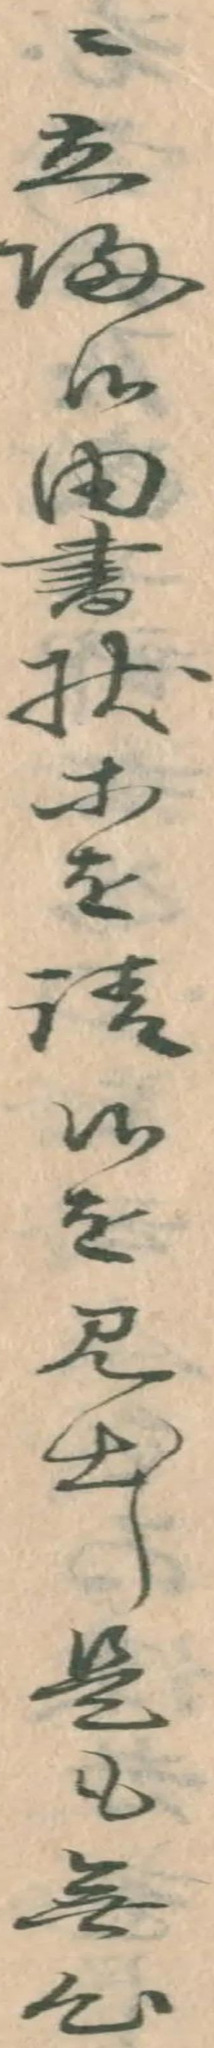に立帰候由書状等を請候を見出し是も無心
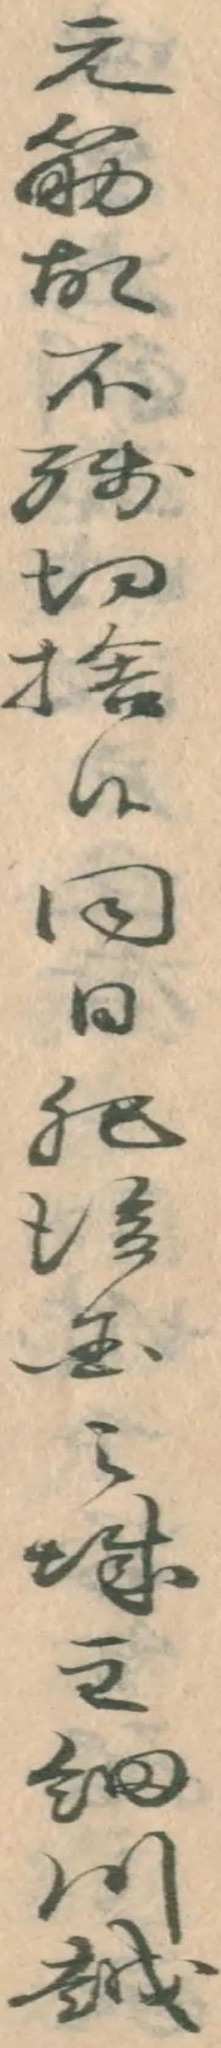元筋故不残切捨候同日肥後国之城主細川越

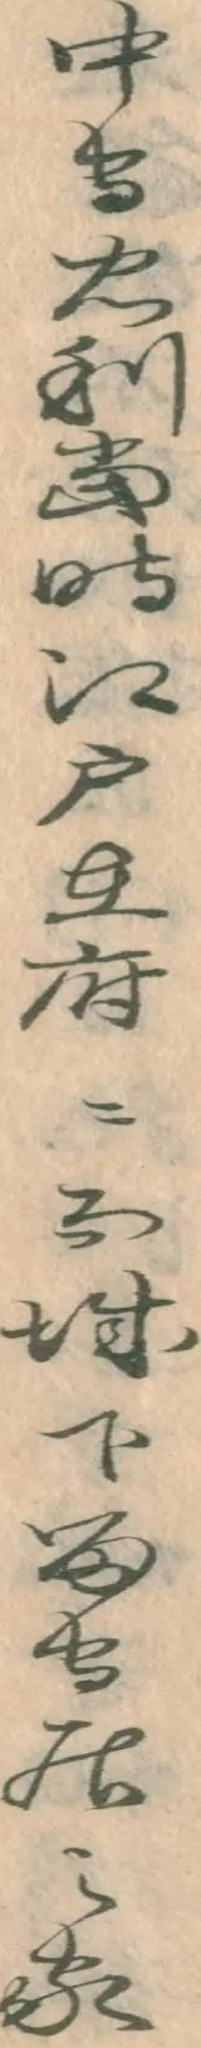中守忠利当時江戸在府に而城下留守居之家
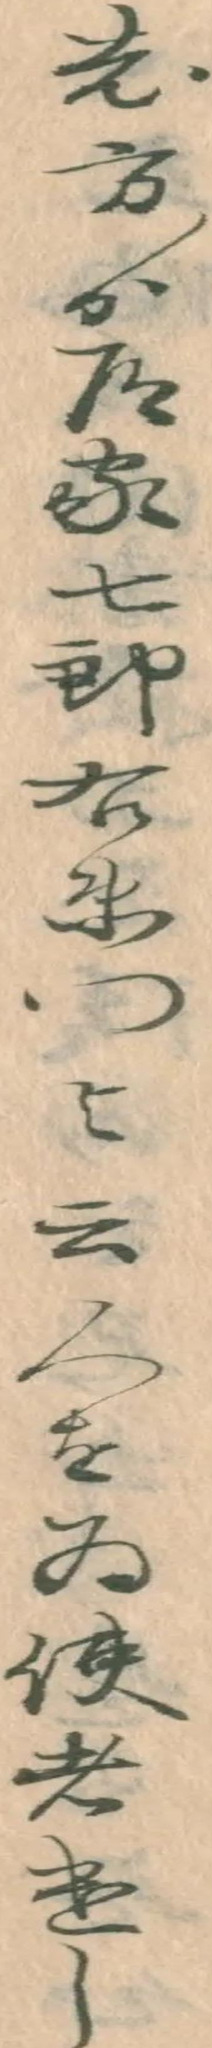老方ゟ道家七郎右衛門与云人をゐ使者遣し
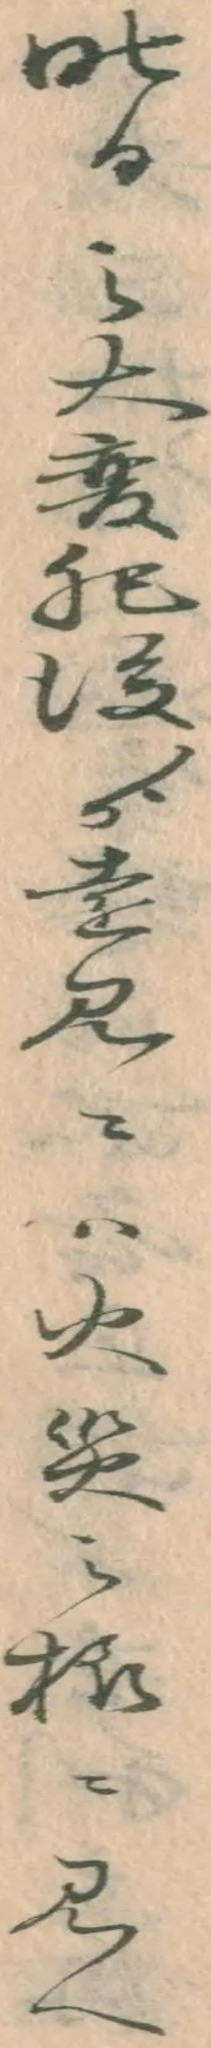昨日之大変肥後ゟ遠見には火災之様に見へ
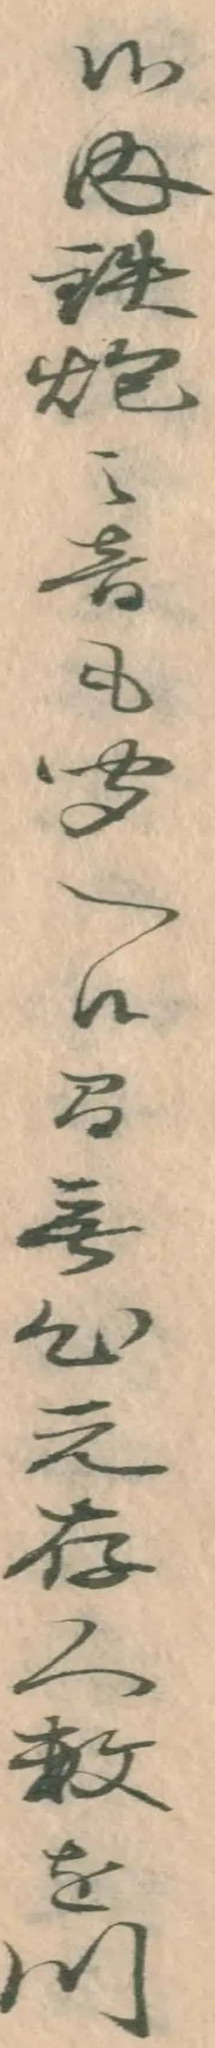候内鉄砲之音も聞へ候間無心元存人数を川
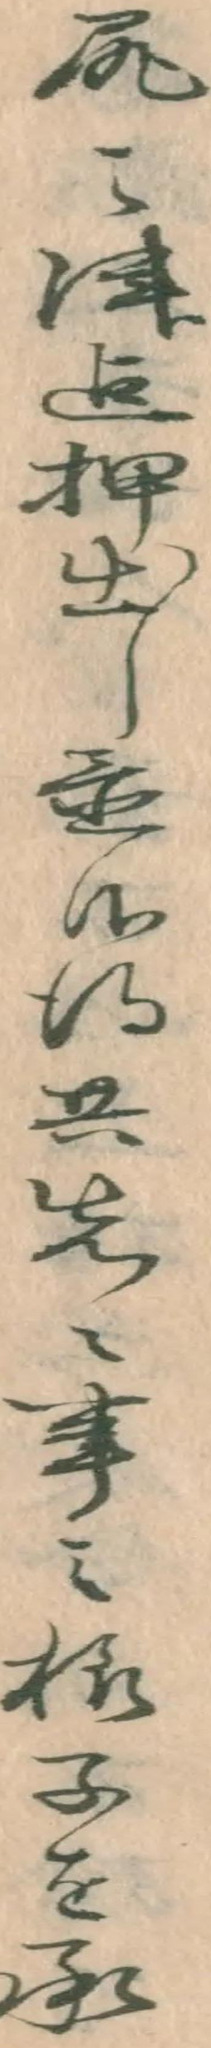尻之津迄押出し置候得共先々事之様子を承
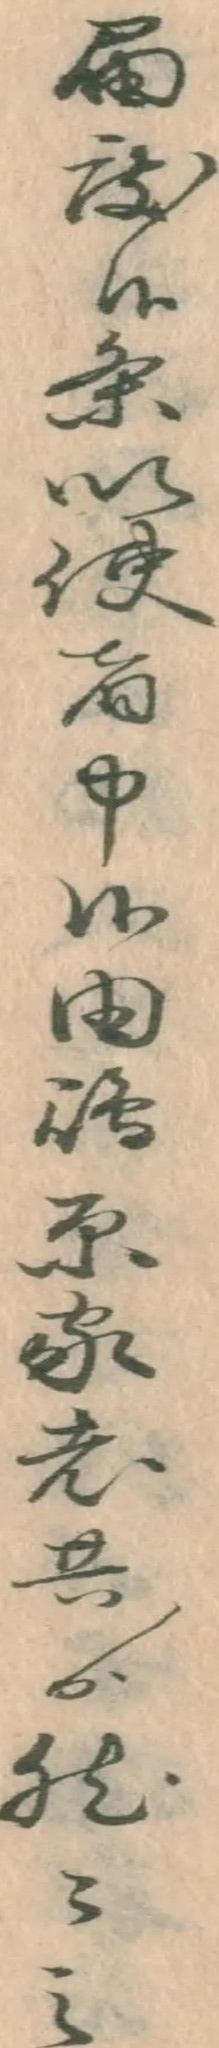届度候条以使者申候由島原家老共ゟ然々之
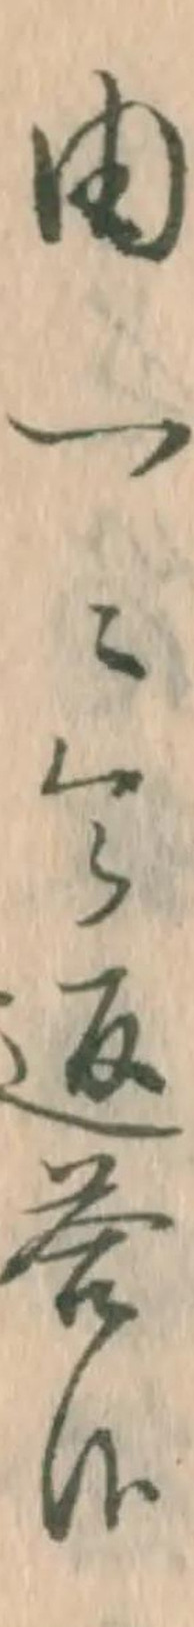由一に令返答候
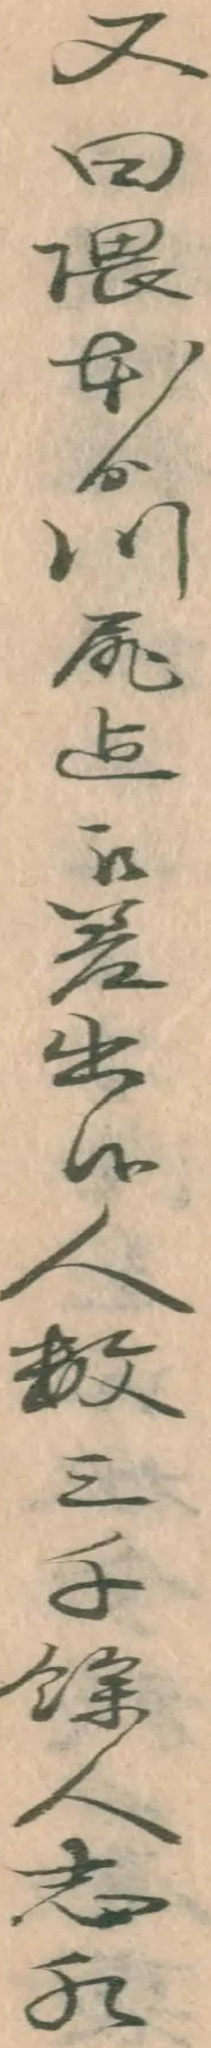又曰隈本ゟ川尻迄江差出候人数三千余人志水
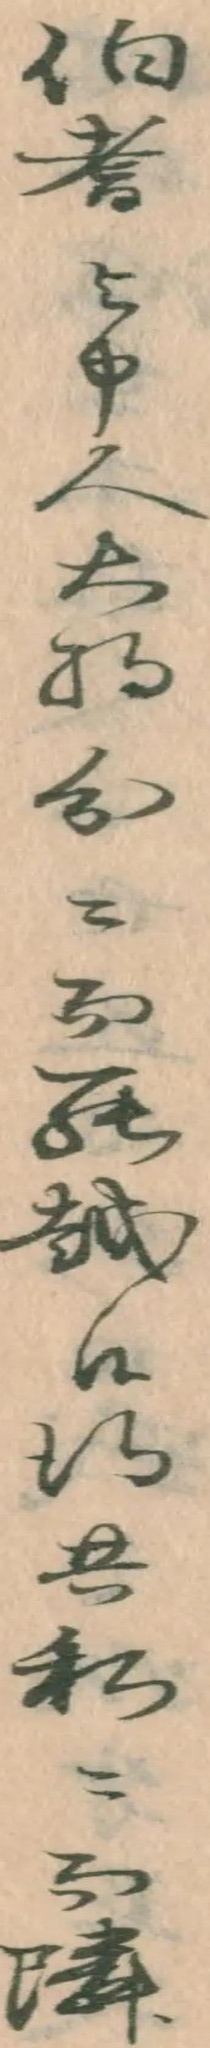伯耆と申人大将分に而罷越候得共私に而隣
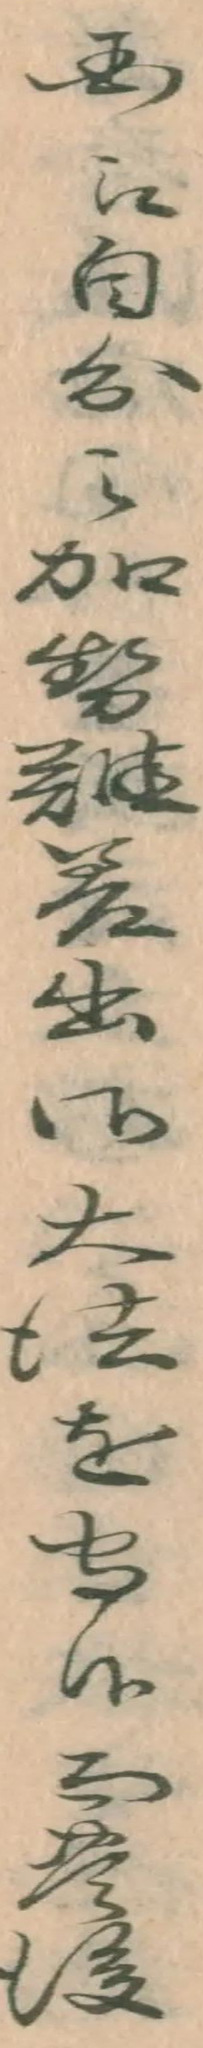国江自分之加勢難差出御大法を守候而豊後
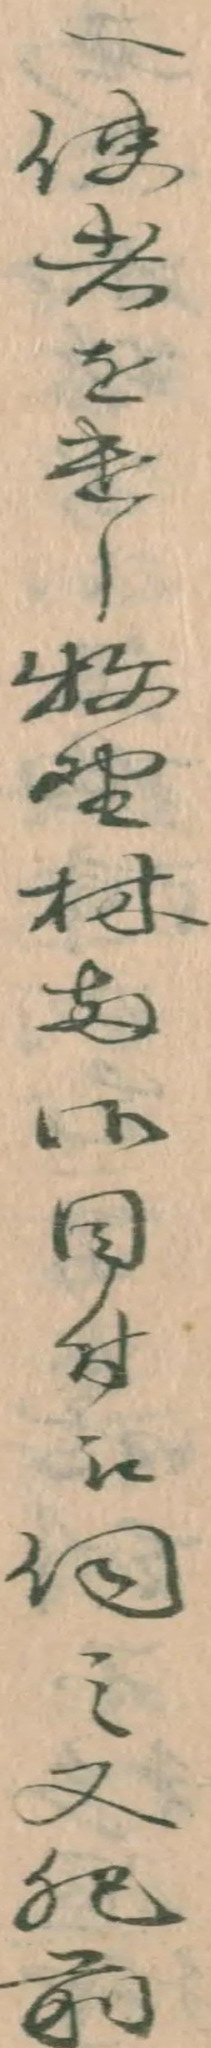へ使者を遣し牧野林両御目付江伺之又肥前
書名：切支丹御退治記 49巻. [2]
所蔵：国立国会図書館 National Diet Library, JAPAN
